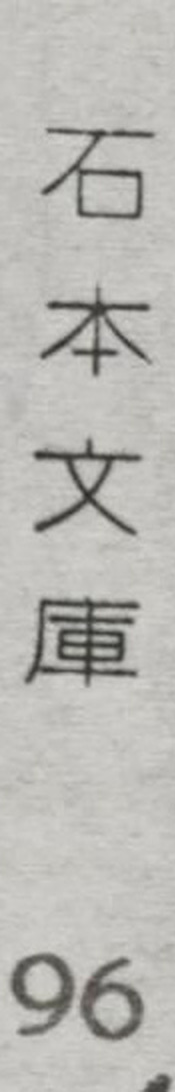石本文庫-
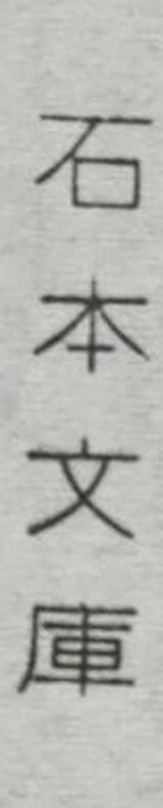石本文庫-
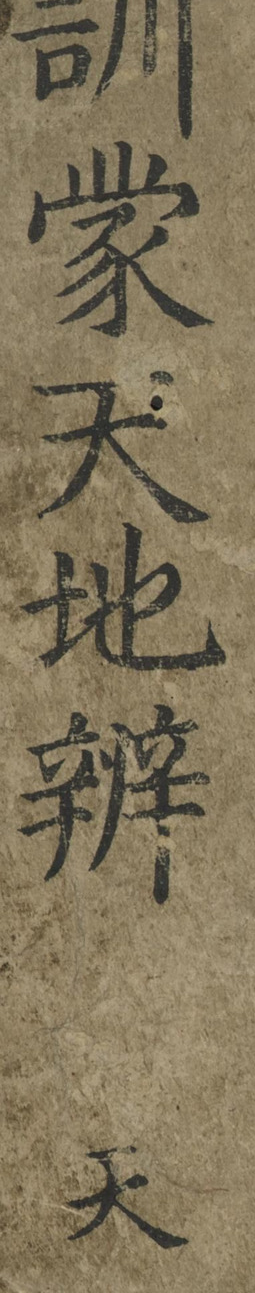訓蒙天地辨天

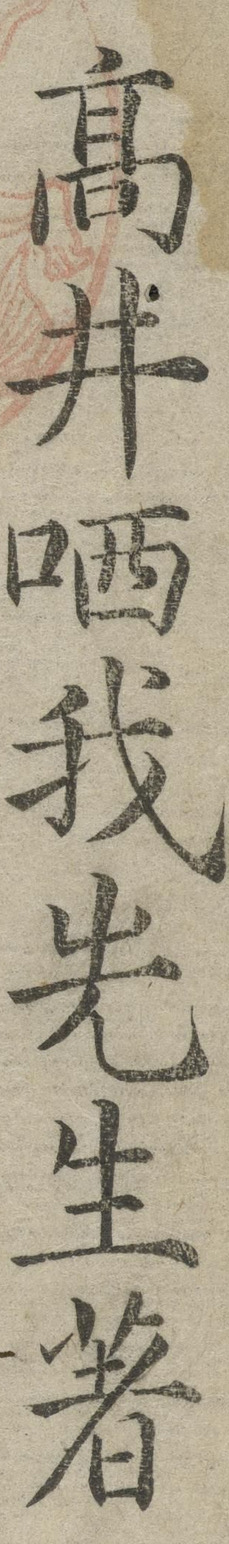髙井哂我先生著
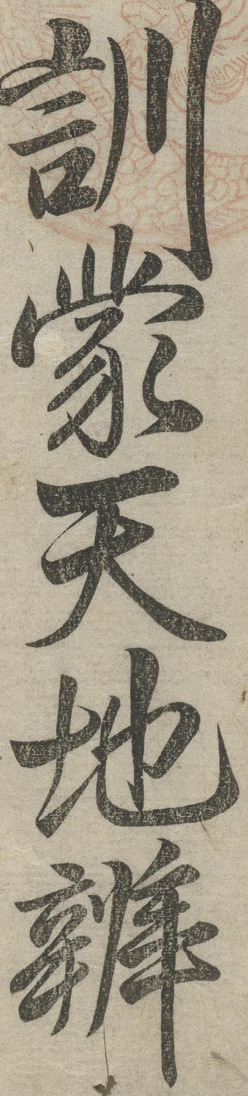訓蒙天地辨
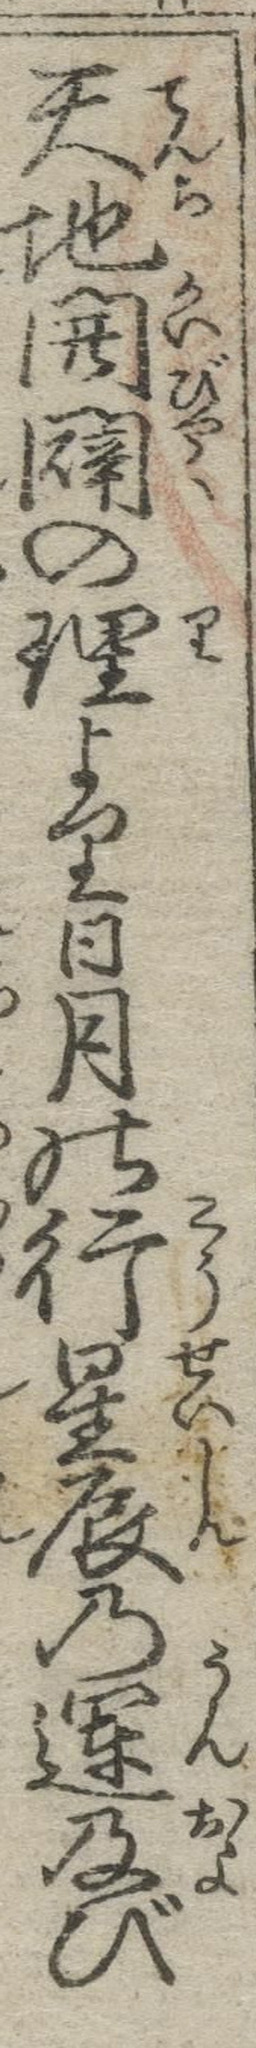天地開闢の理より日月の行星辰の運及び
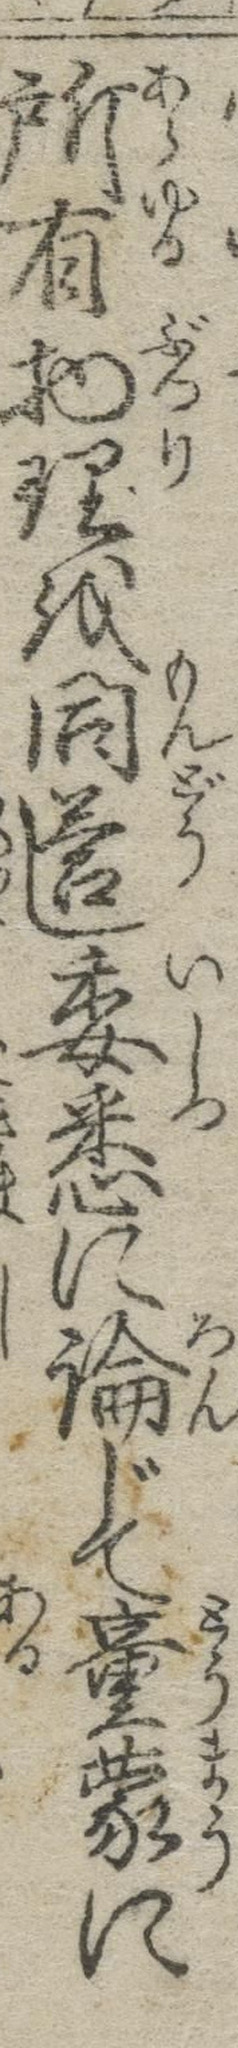所有物理を問答委悉に論じて童蒙に青黎閣
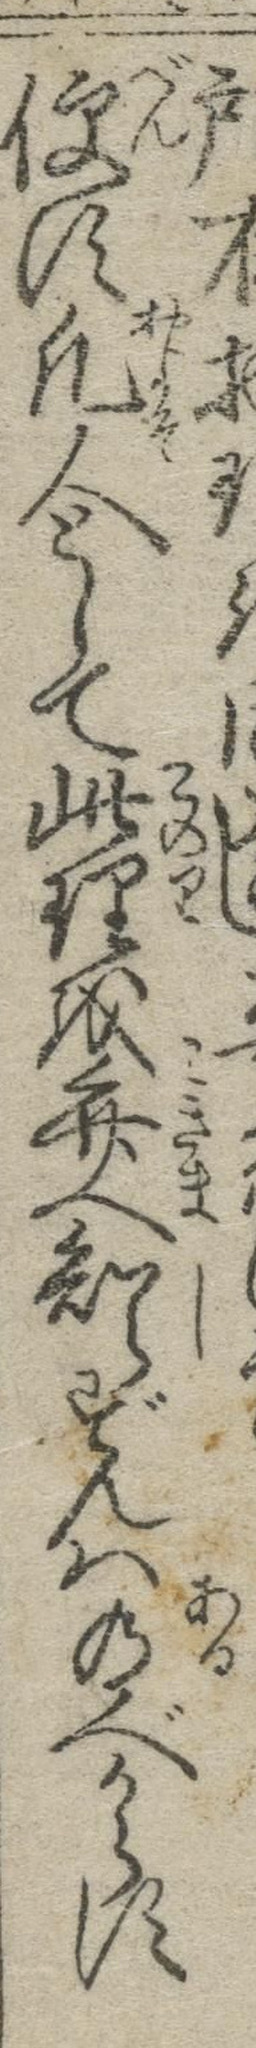便す凡人として此理を弁へ知らずんは有べからす
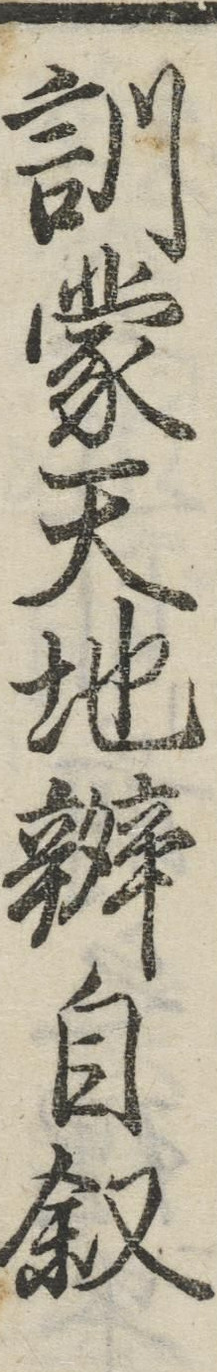訓蒙天地辨自叙
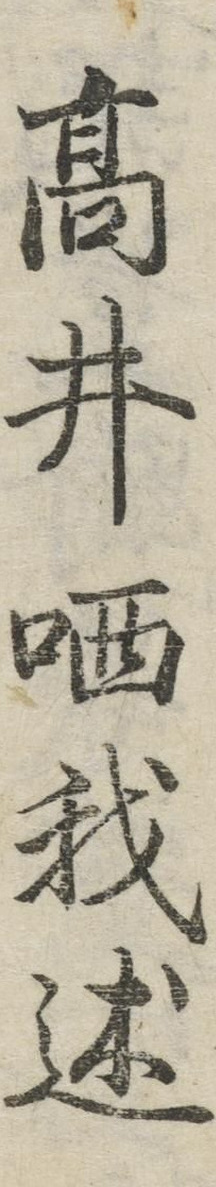高井哂我述
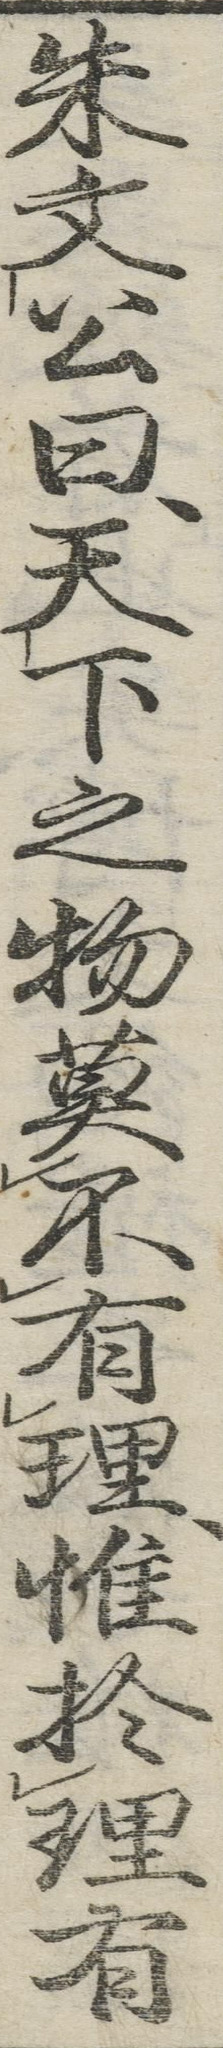朱文公曰、天下之物莫不有理、惟於理有
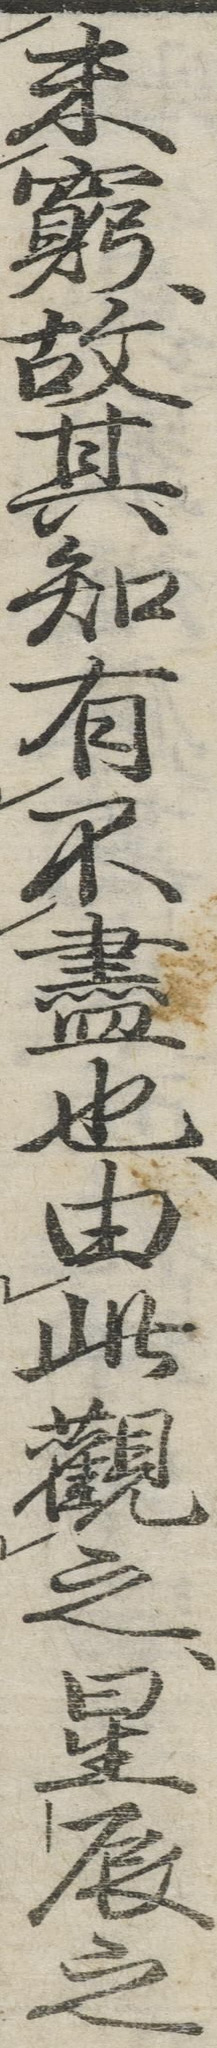未窮、故其知有不盡也、由此觀之、星辰之
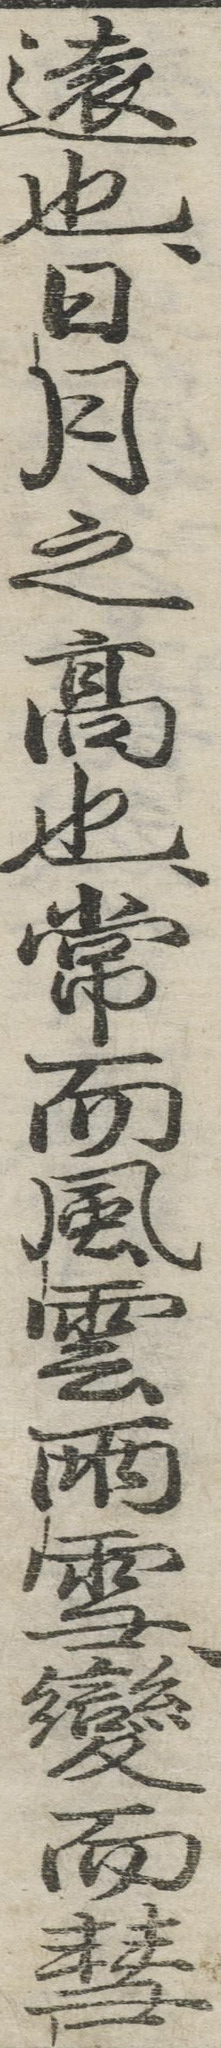遠也、日月之高也、常而風雲雨雪、變而彗
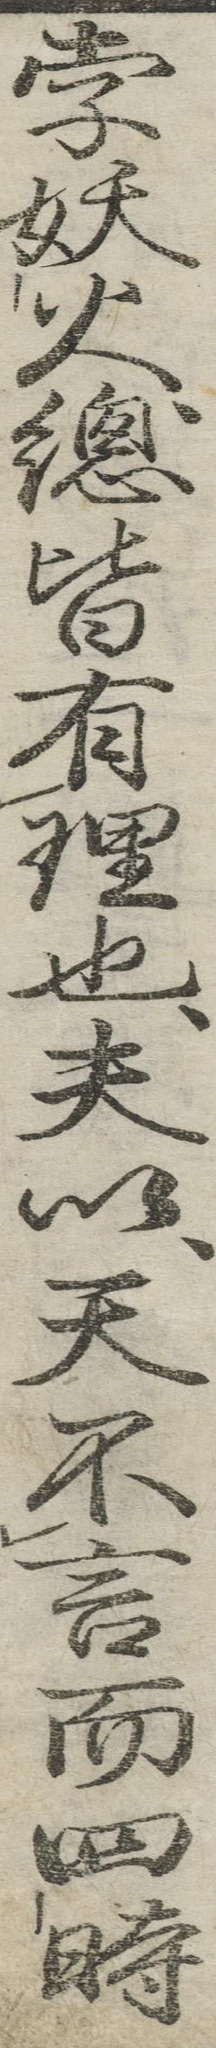孛妖火、總皆有理也、夫以、天不言而四時
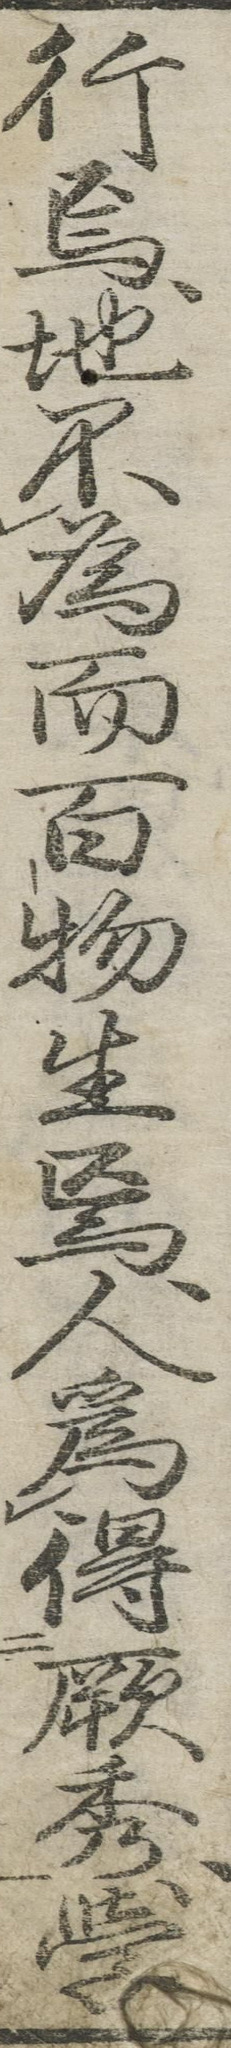行焉、地不為而百物生焉、人為得厥秀、學
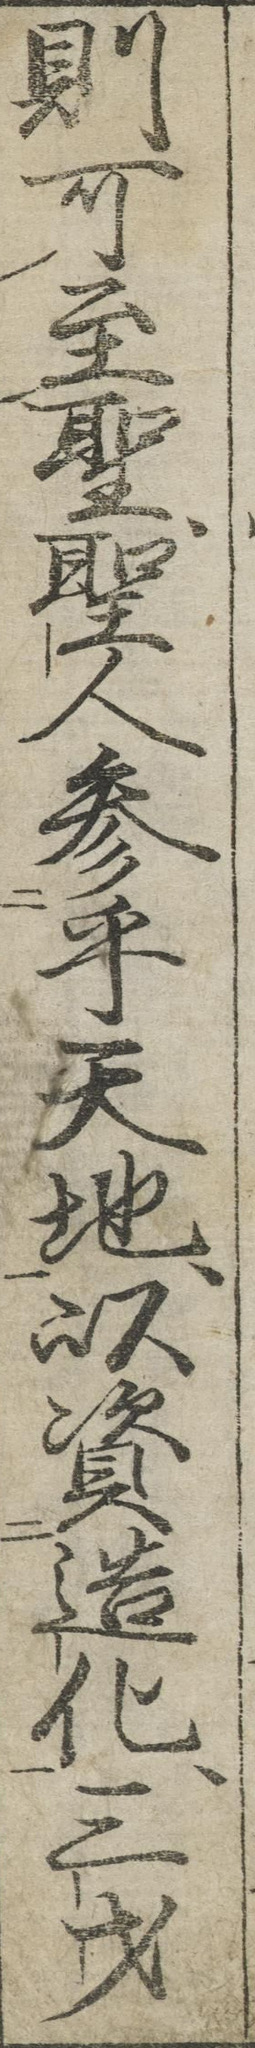則可至聖、聖人參乎天地、以資造化、三才
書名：訓蒙天地辨　天
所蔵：東京大学地震研究所図書室 Earthquake Research Institute Library, The University of Tokyo, JAPAN
